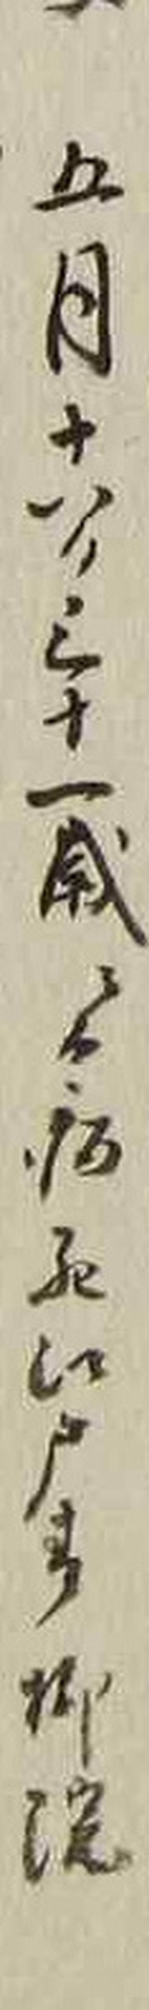五月十八日三十一歳ニ而病死江戸青柳院
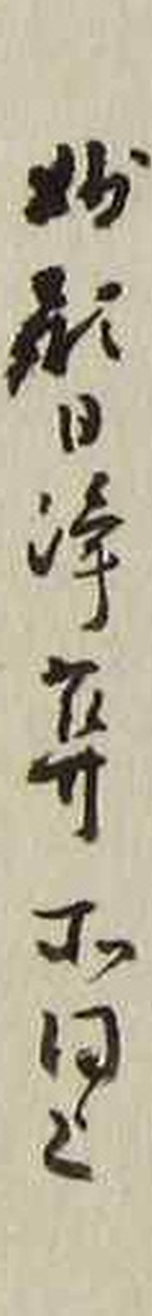妙顕日浄葬所同上
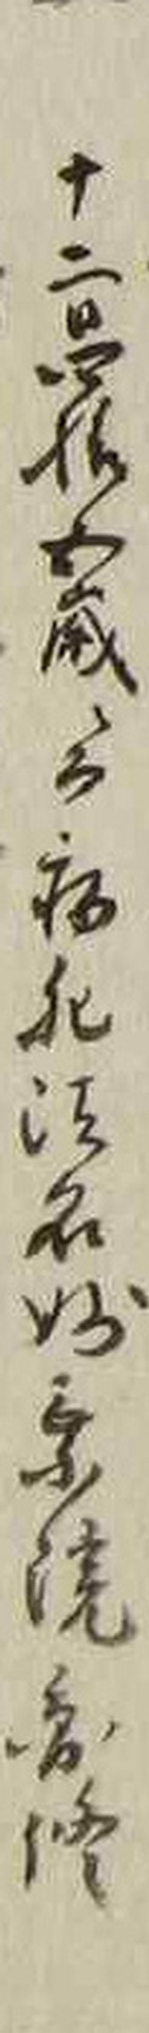十二日四拾五歳ニ而病死法名妙乗院円修
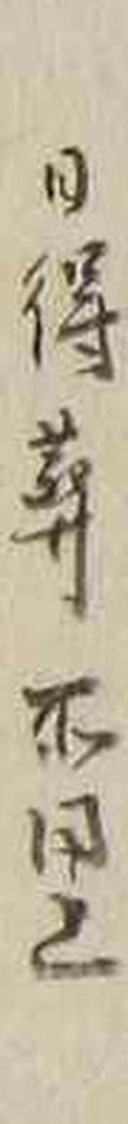日得葬所同上

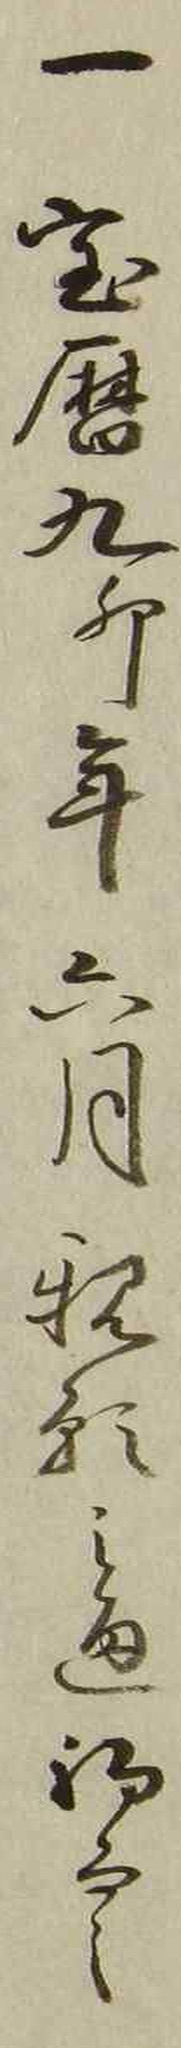一宝暦九卯年六月親願之通初而之
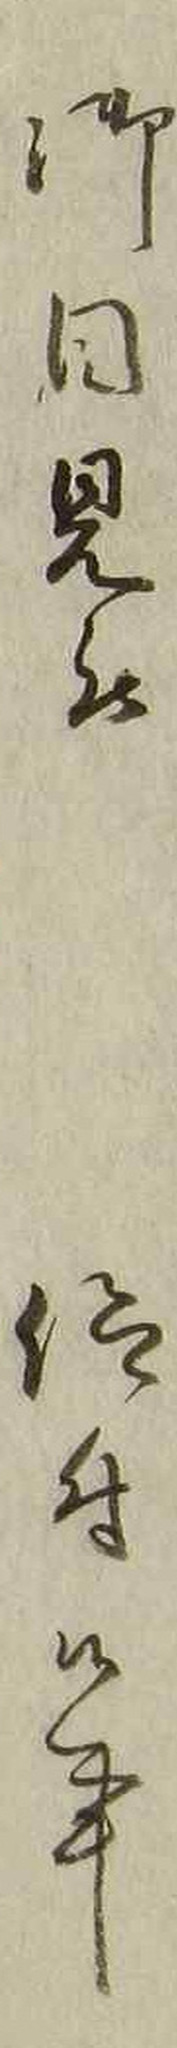御目見被仰付候事
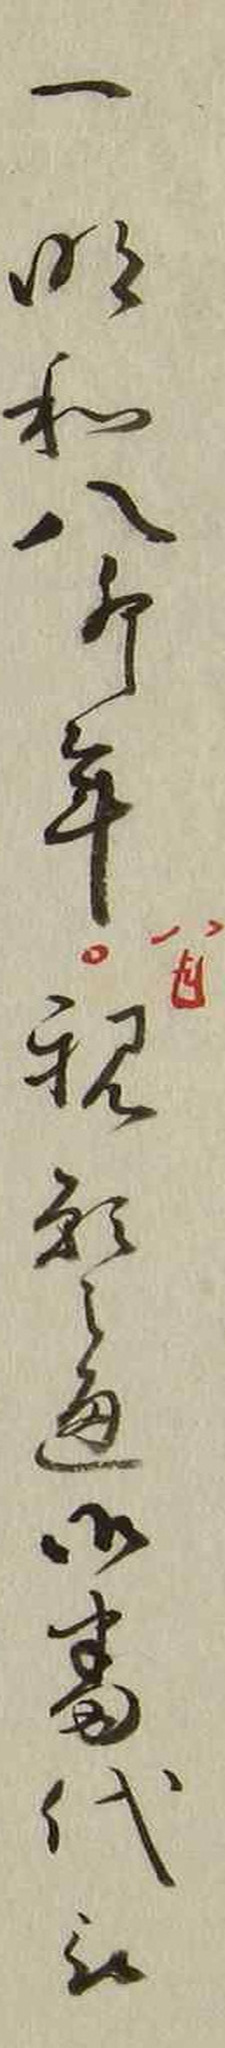一明和八卯年◦親願之通御番代被
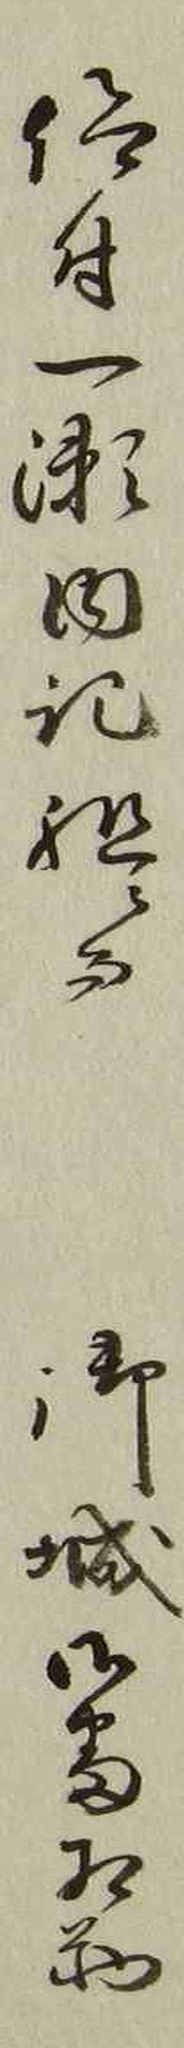仰付一瀬内記組ニ而御城御番相勤
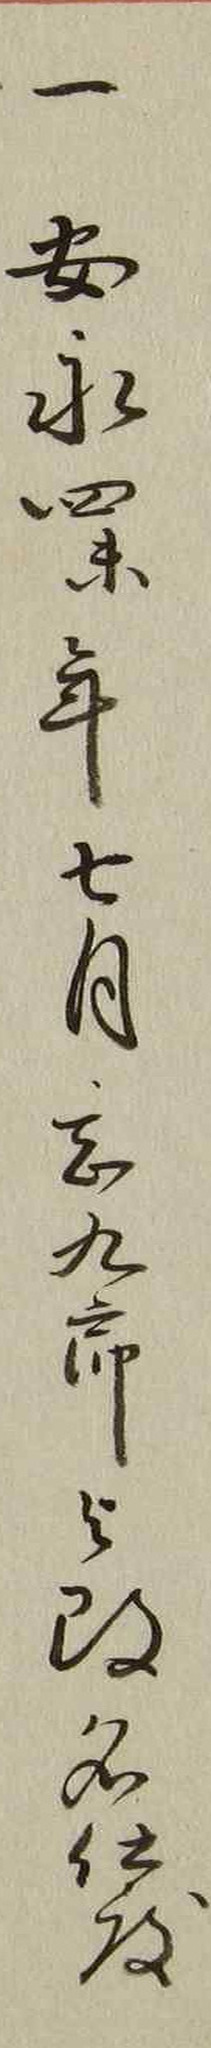一安永四未年七月甚九郎与改名仕度
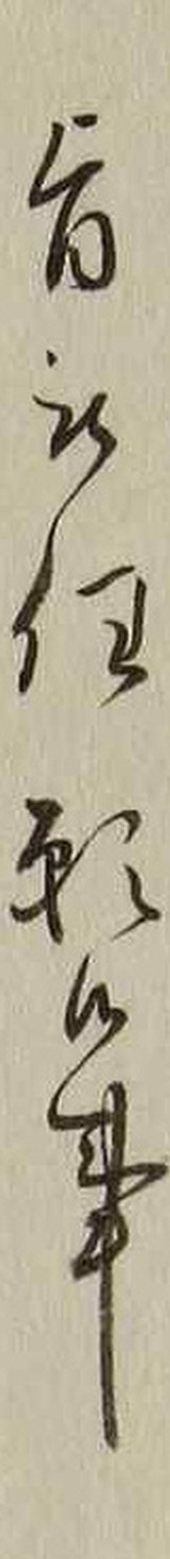旨被任願候事
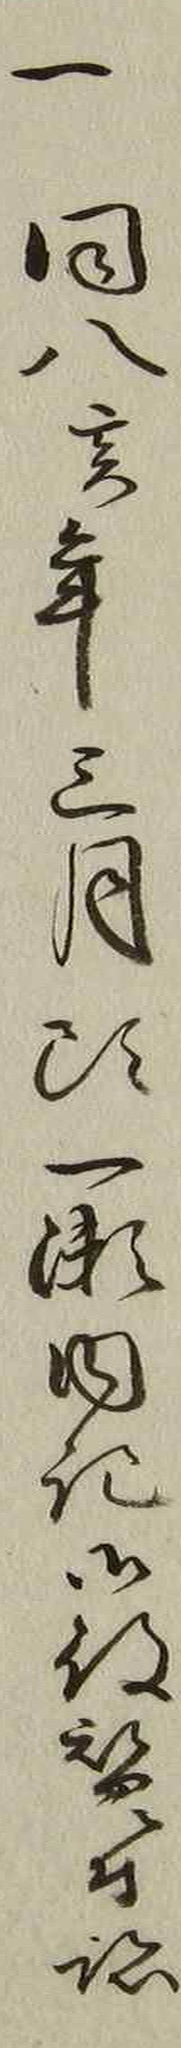一同八亥年三月頭一瀬内記御役替ニ付跡
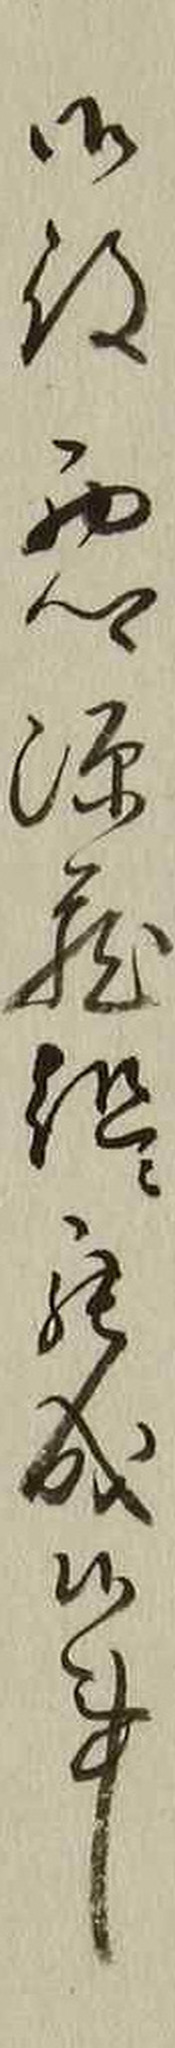御役西郷源蔵ニ罷成候事
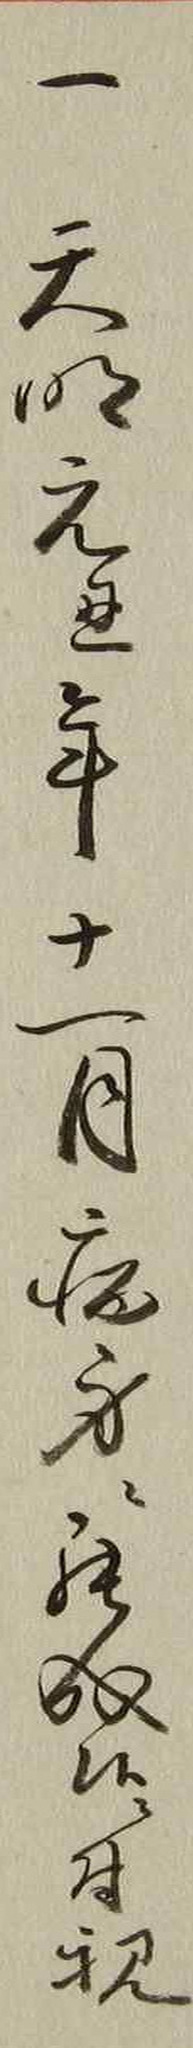一天明元丑年十一月病身ニ罷成候ニ付親
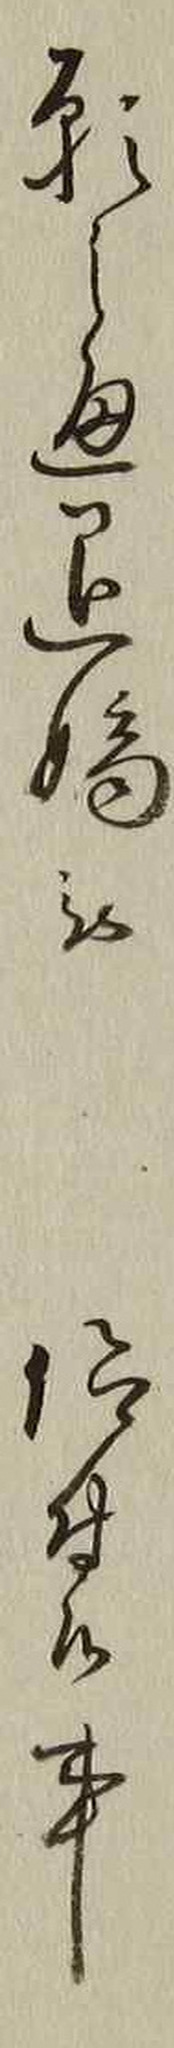願之通退嫡被仰付候事
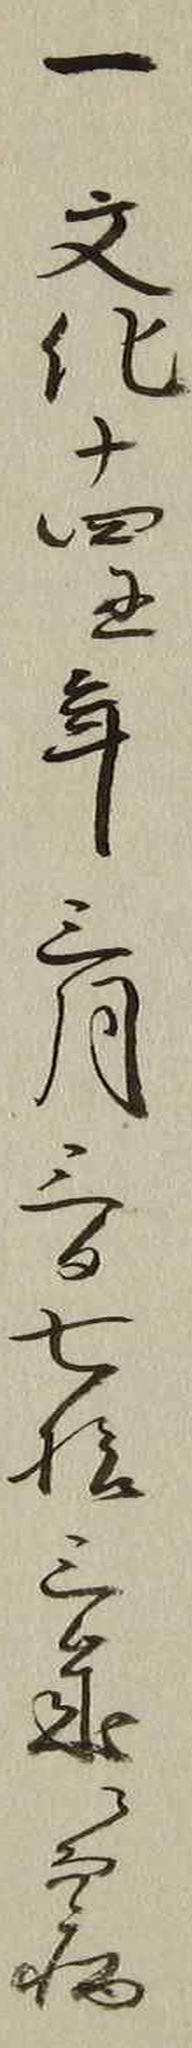一文化十四丑年三月三日七拾三歳ニ而病
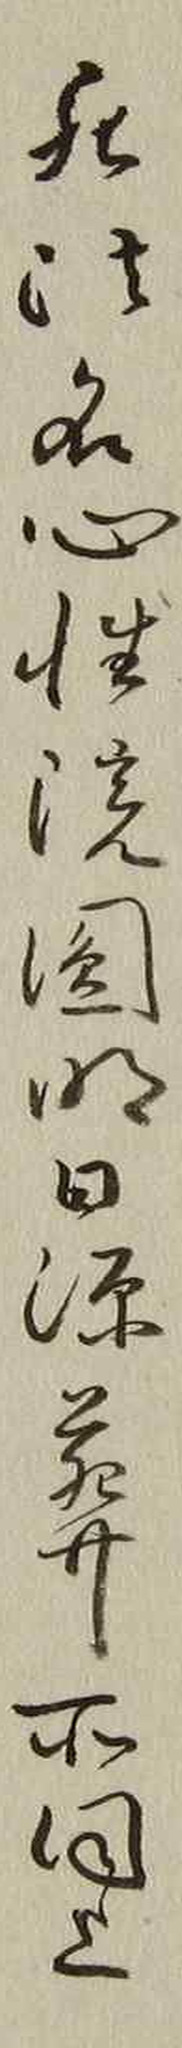死法名心性院円明日源葬所同上
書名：諸士系譜　巻之4　い之部4
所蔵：会津若松市立会津図書館
